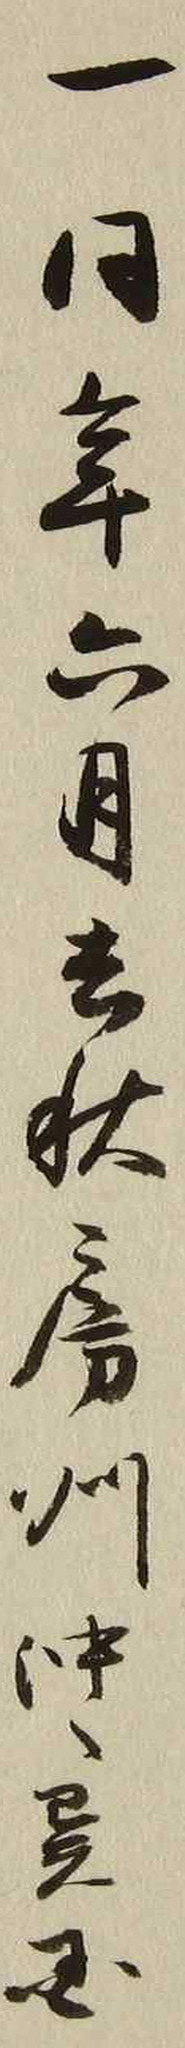一同年六月去秋房州沖へ異国
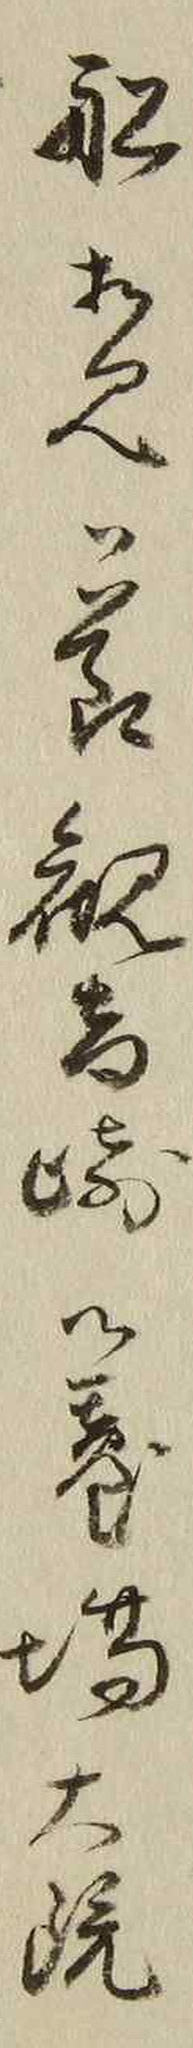船相見候節観音崎御台場大銃
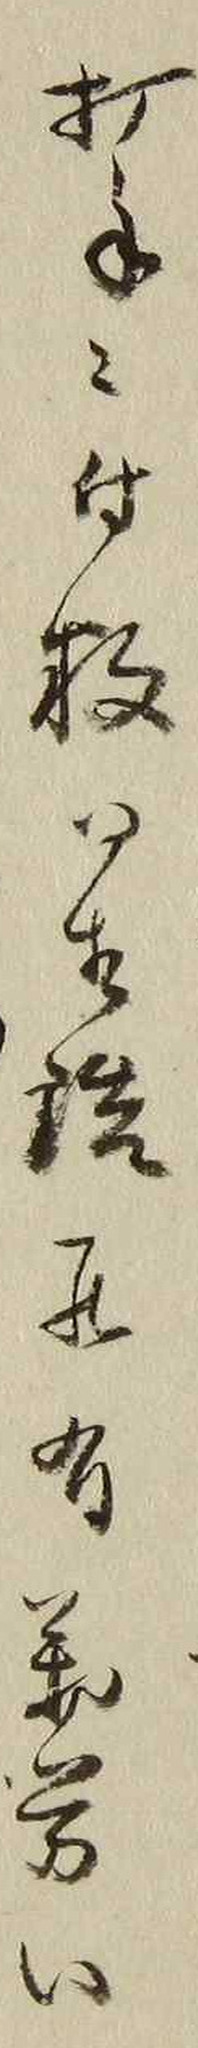打手ニ付数日相詰罷有勤労い
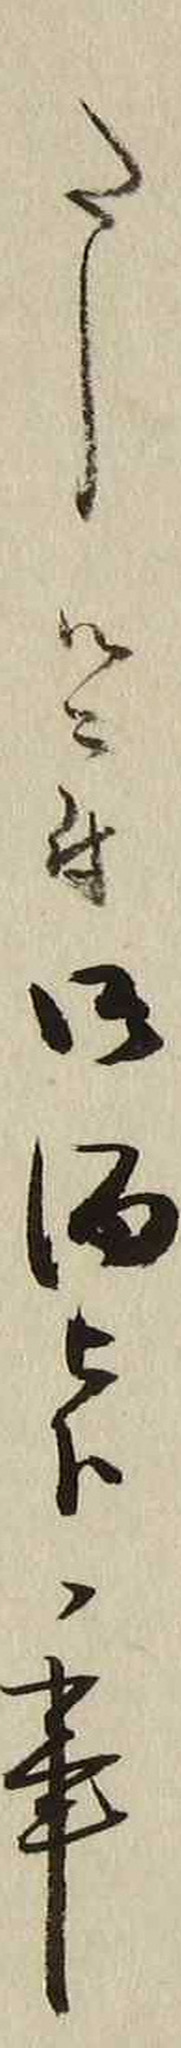たし候ニ付御酒被下候事
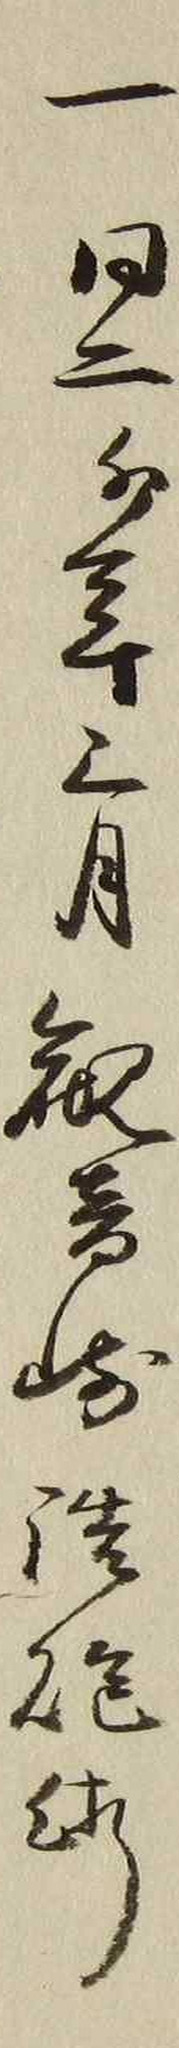一同二卯年三月観音崎詰砲術
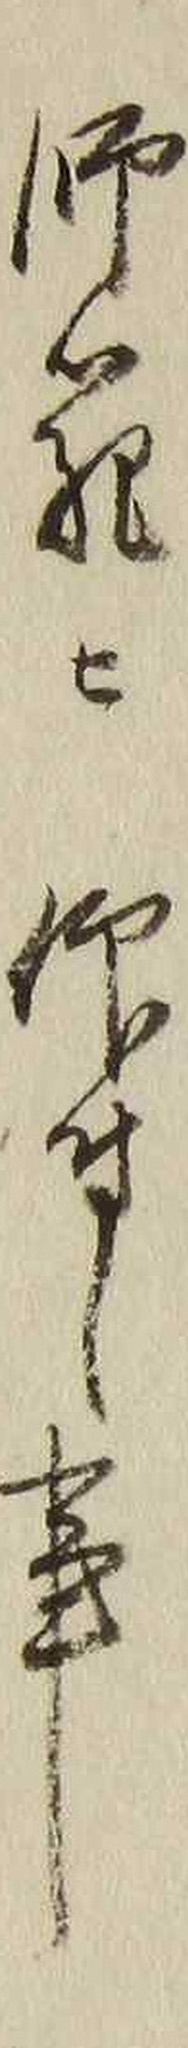師範被仰付候事
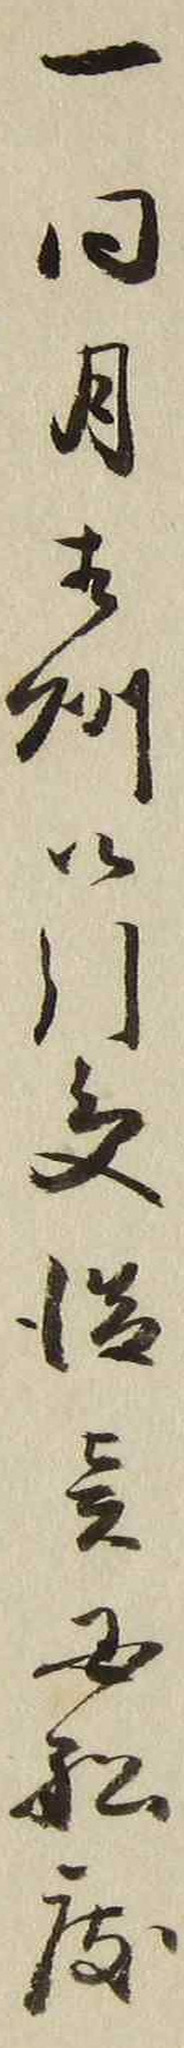一同月相州御引受後異国船度
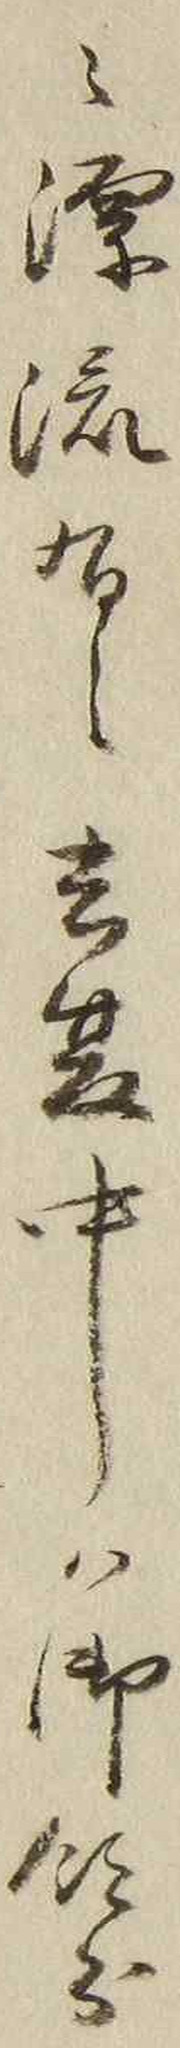々漂流有之去夏中は御領分
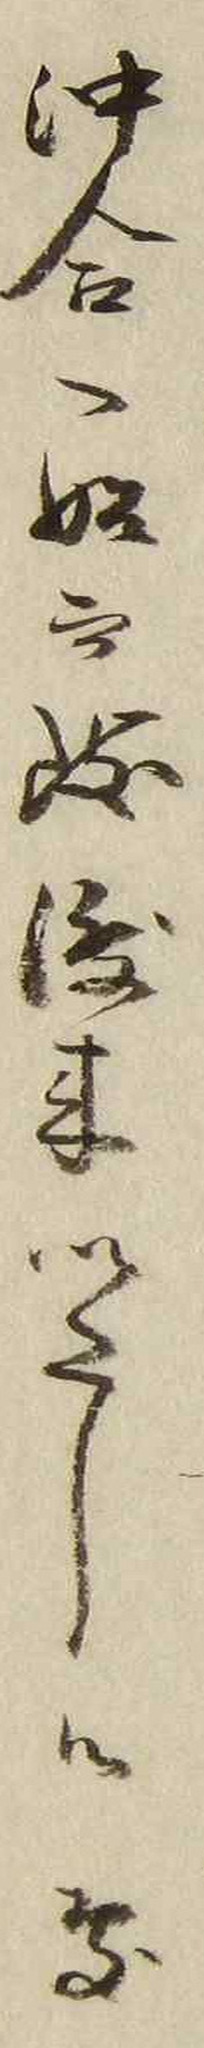沖合へ始而致渡来いたし候処

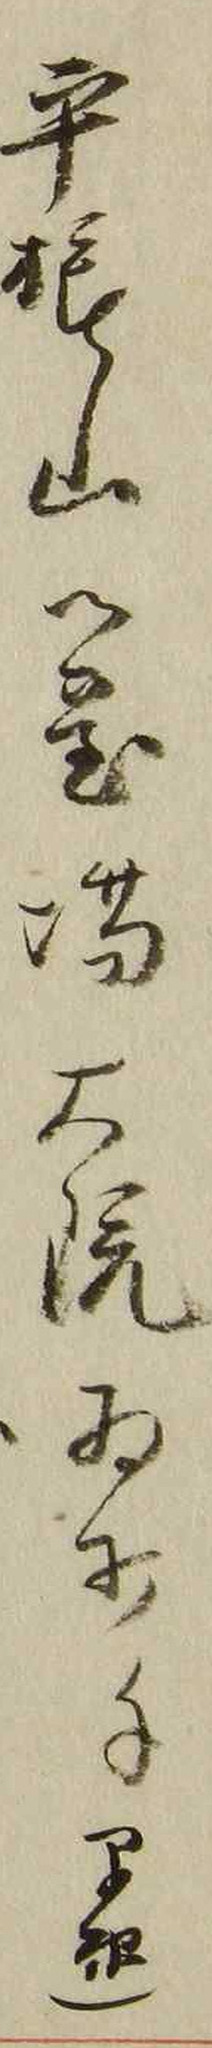平根山御台場大銃為打手早速
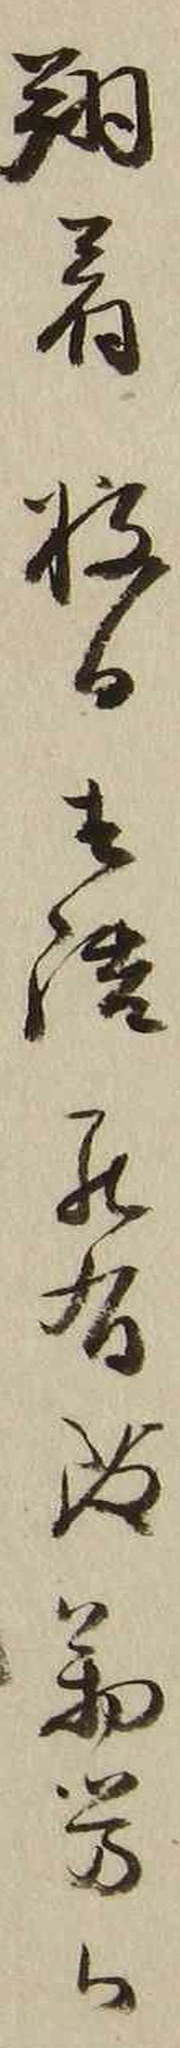翔着数日相詰罷有致勤労候
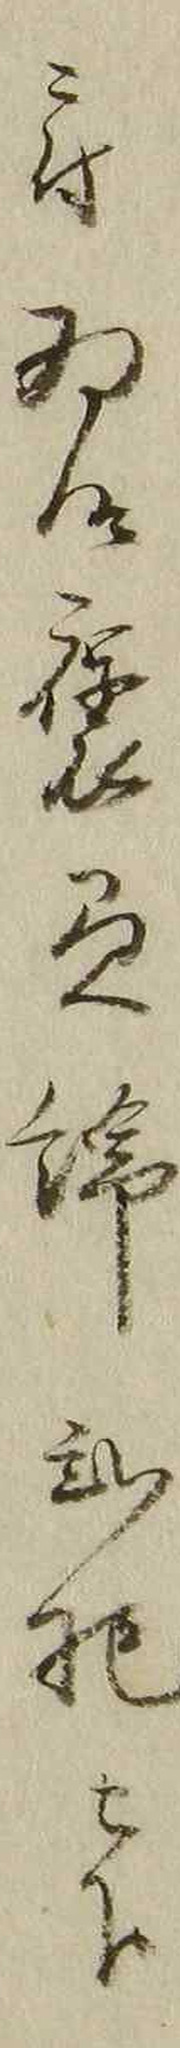ニ付為御褒美綿弐把被下
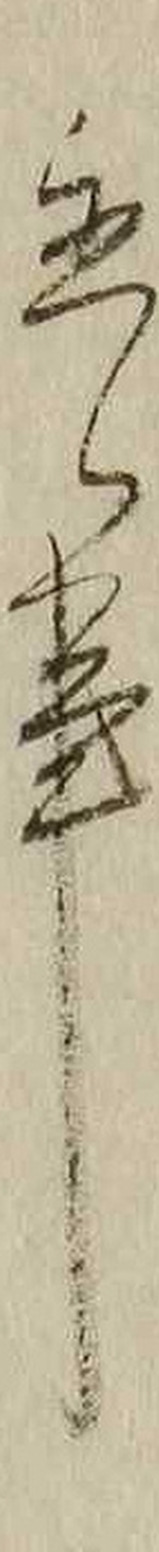置候事
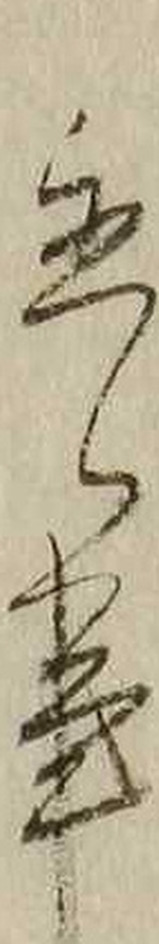置候事
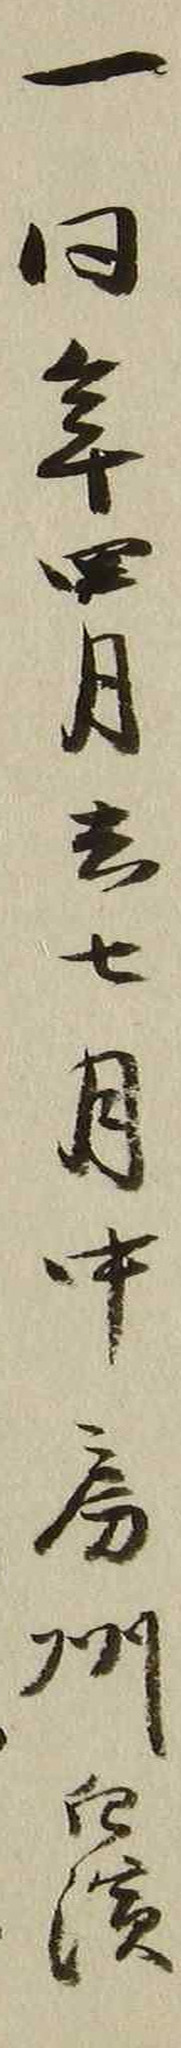一同年四月去七月中房州白浜
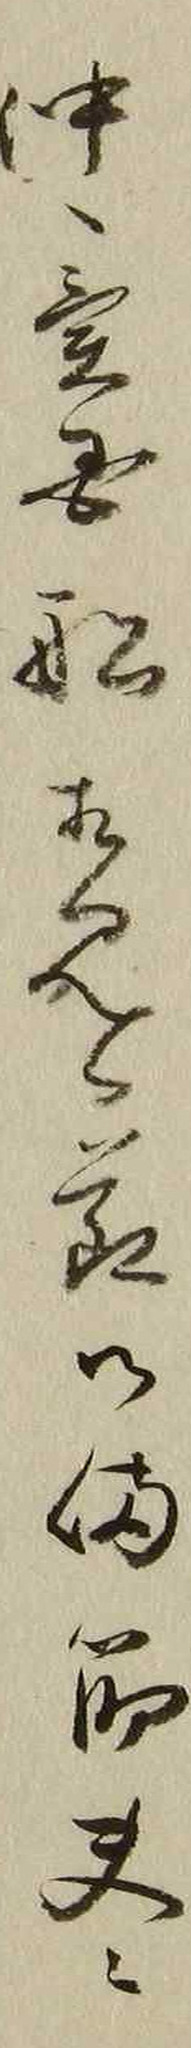沖へ異国船相見候節御備筋夫々
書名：諸士系譜　巻之288　さ之部20
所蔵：会津若松市立会津図書館
